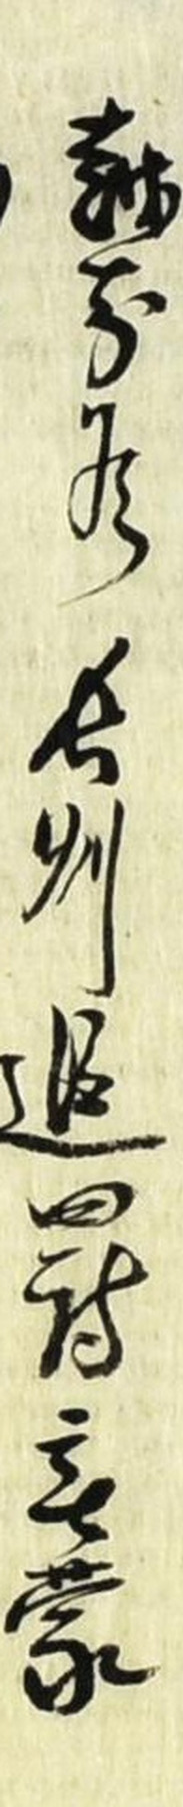越前侯長州追罰被蒙
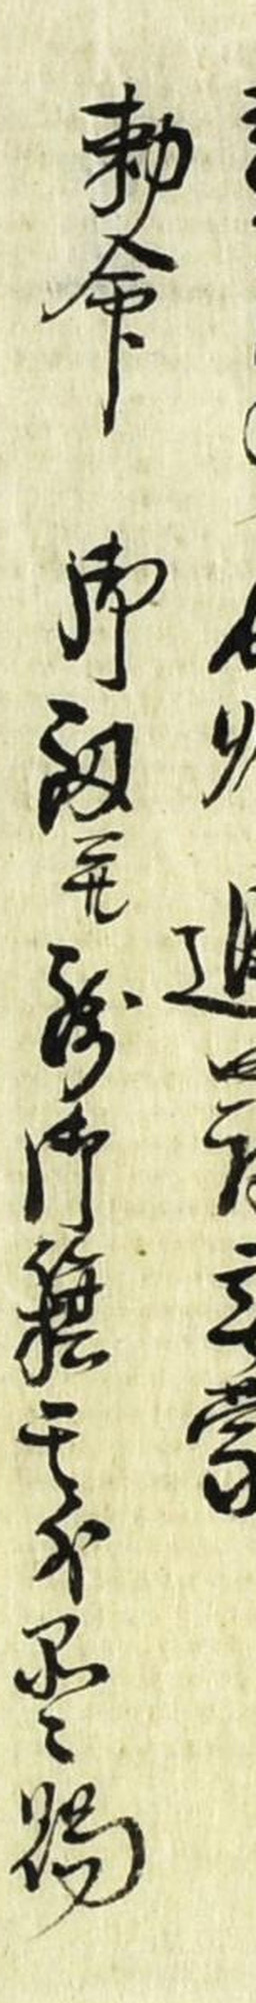勅命御剣幷錦御籏其外品々賜
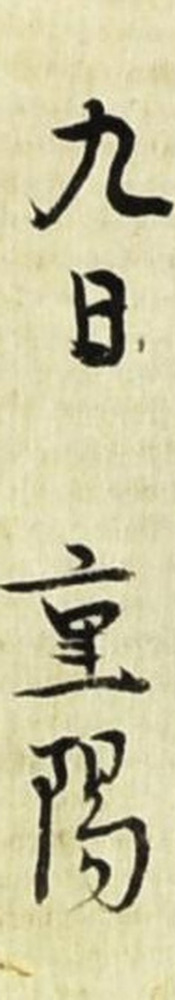九日重陽
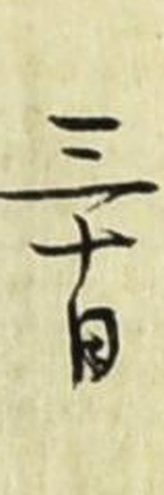三十日

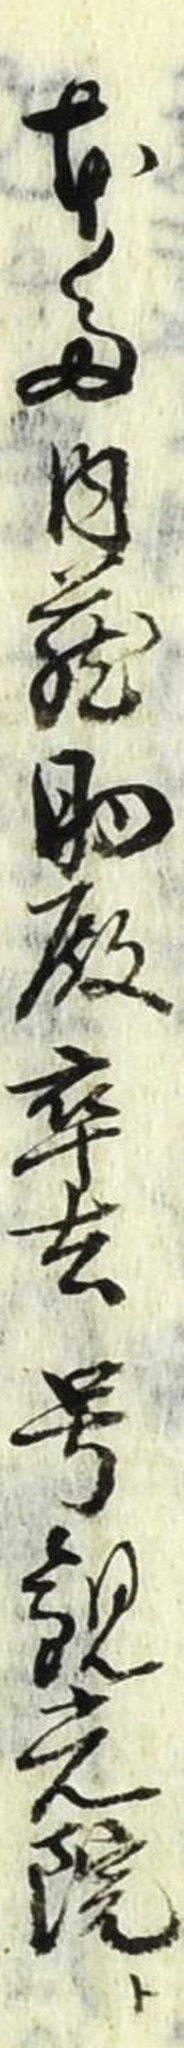本多内蔵助殿卒去号観光院と
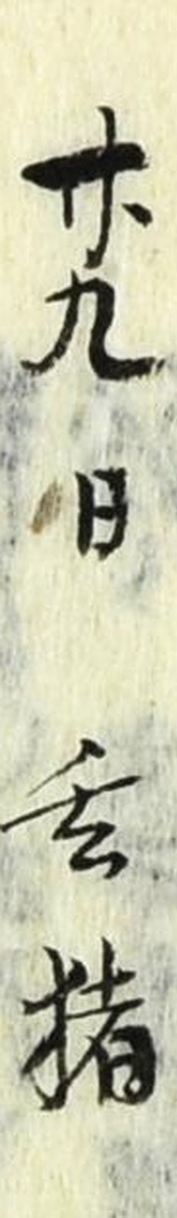廿九日玄猪
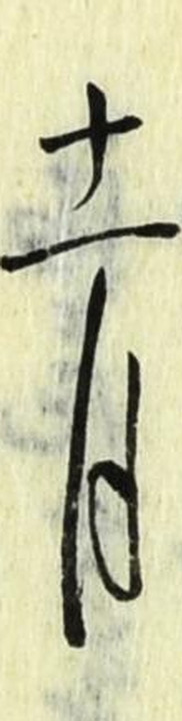十一月
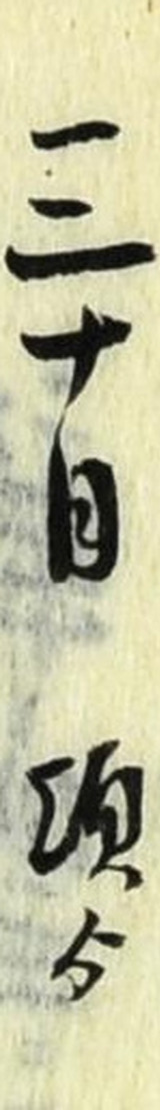三十日頃ゟ
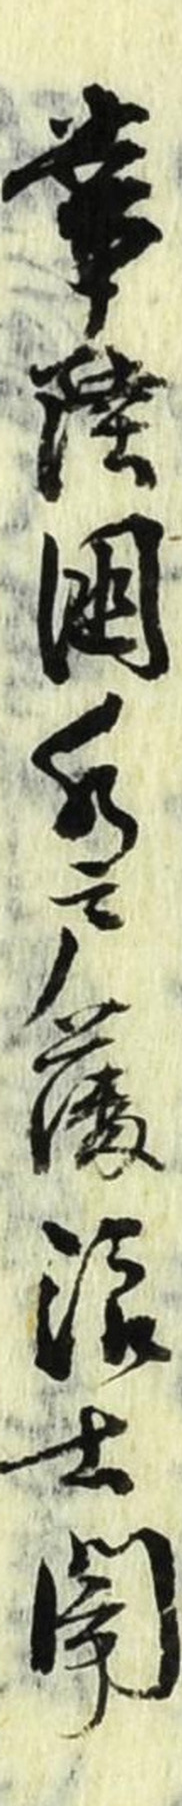常陸国水戸藩浪士閙
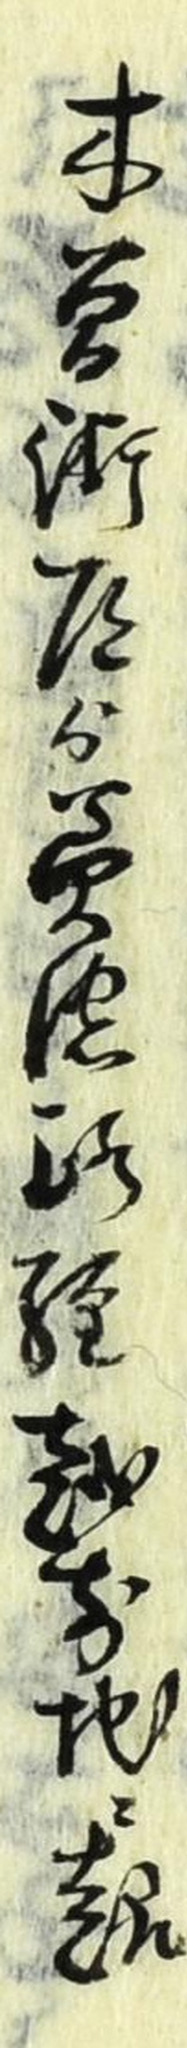木曽街道ゟ美濃路経越前地に趣

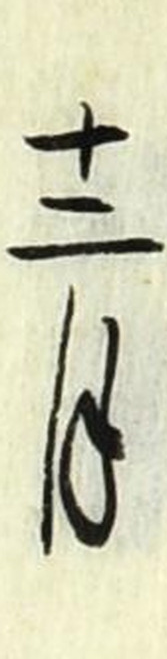十二月
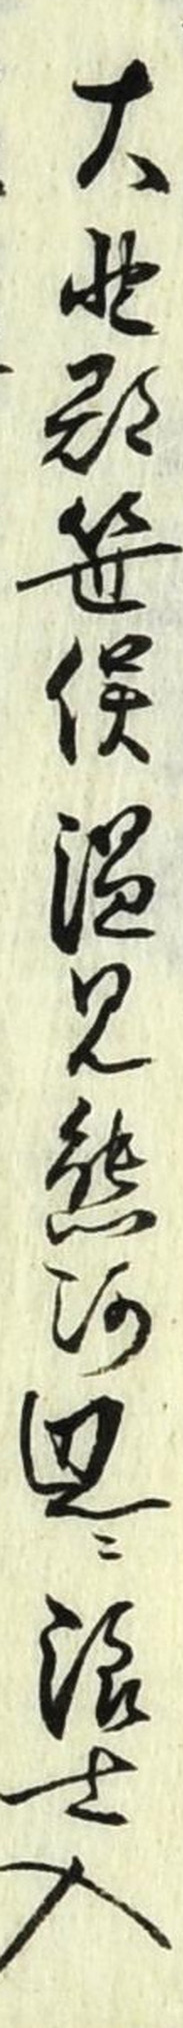大野郡笹俣温見熊河辺に浪士入
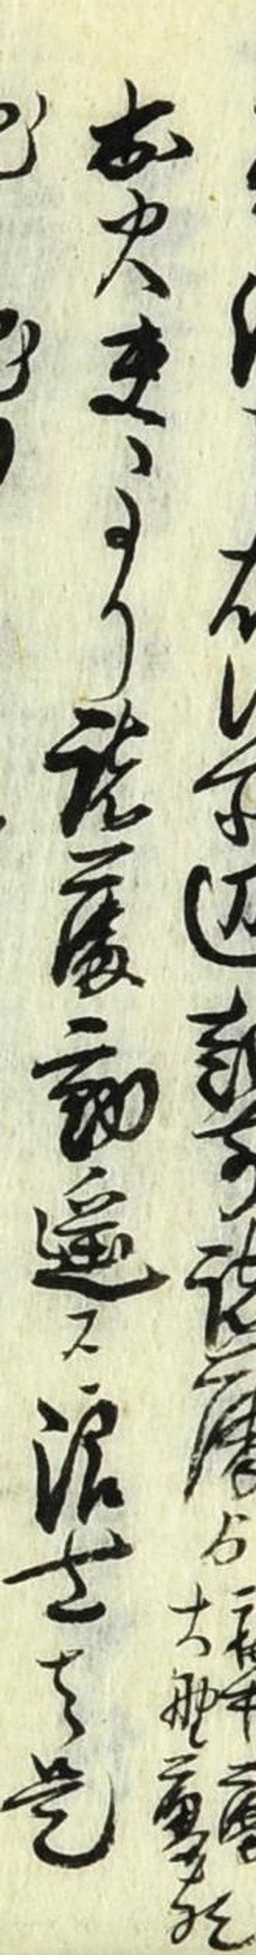出火夫より諸藩動遥す浪士は是
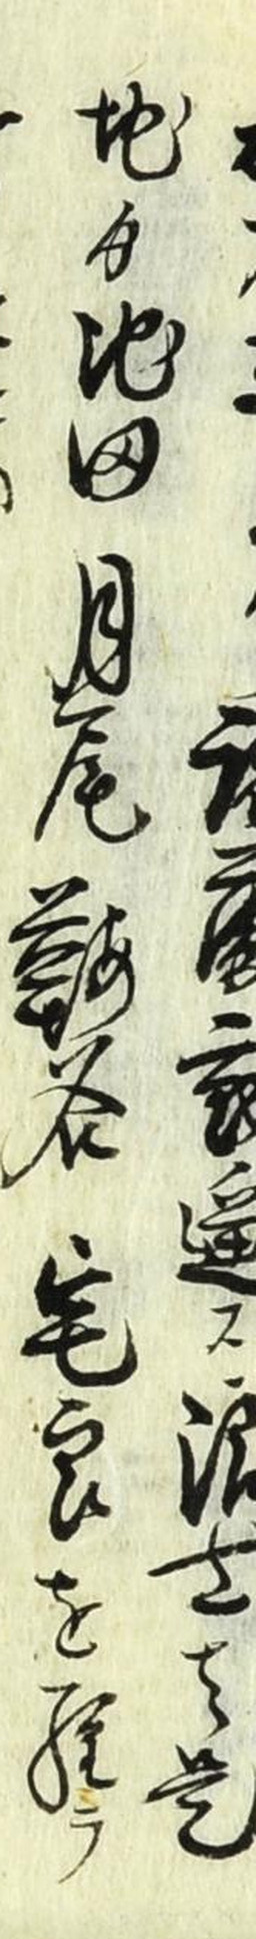地ゟ池田月尾鞍谷宅良を経て
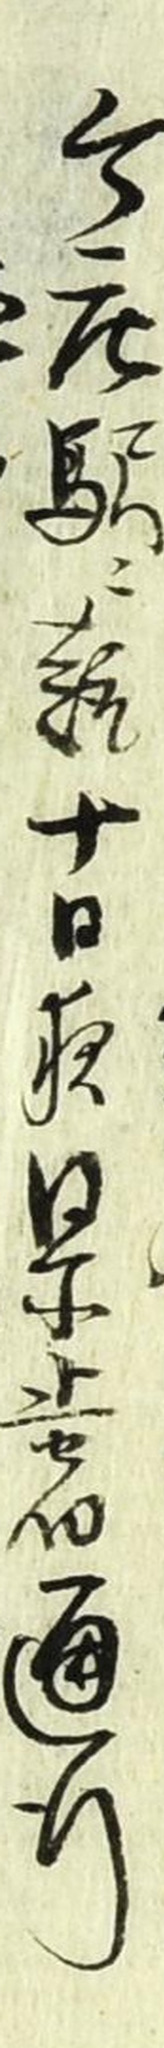今庄駅に趣十日夜同所止宿通行
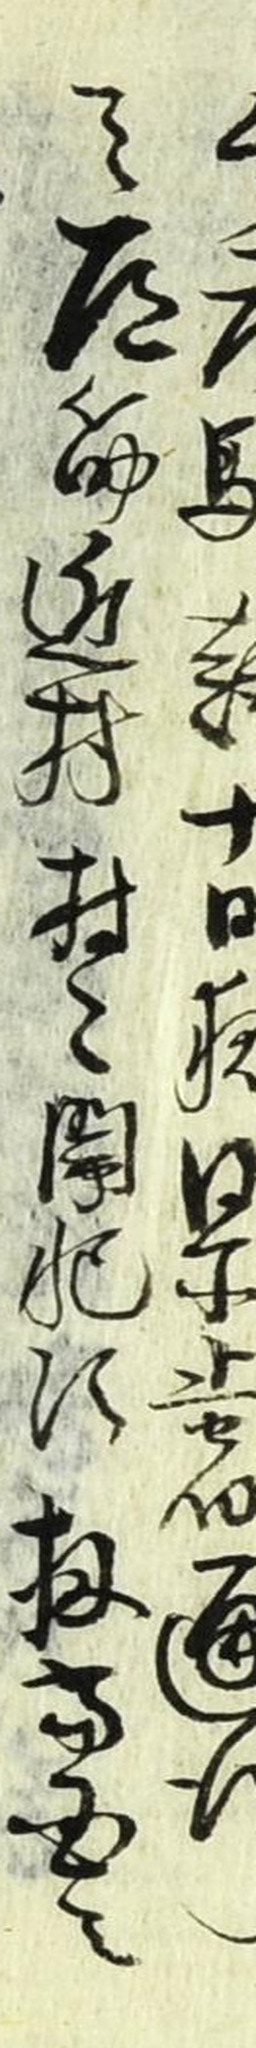之道筋近村村々閙忙す扨当国之
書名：（日記）
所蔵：福井県文書館 Fukui Prefectural Archives
